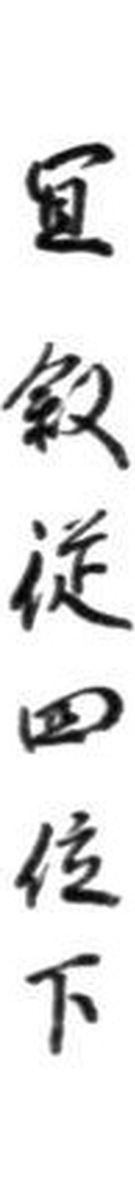宜叙従四位下奉
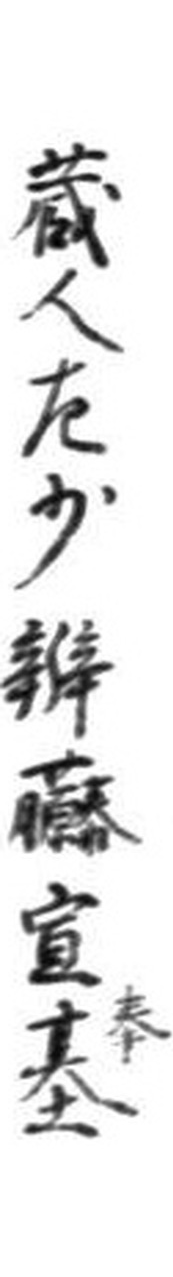蔵人左少弁藤原宣基
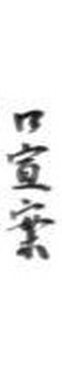口宣案
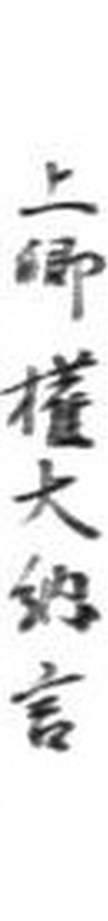上卿権大納言
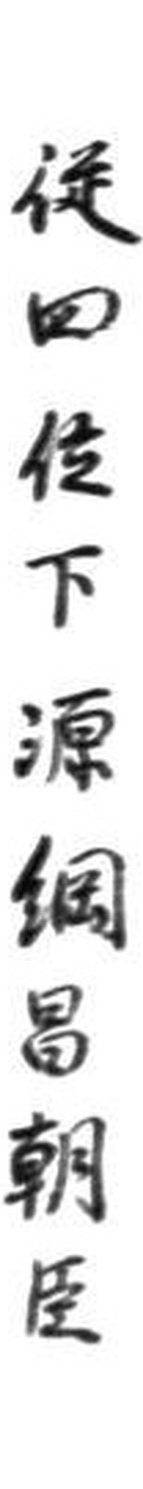従四位下源綱昌朝臣

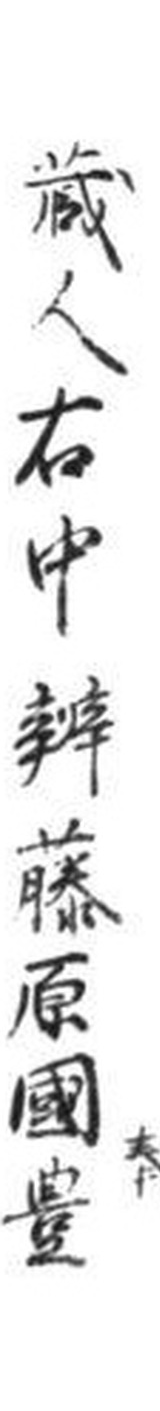蔵人右中弁藤原国豊
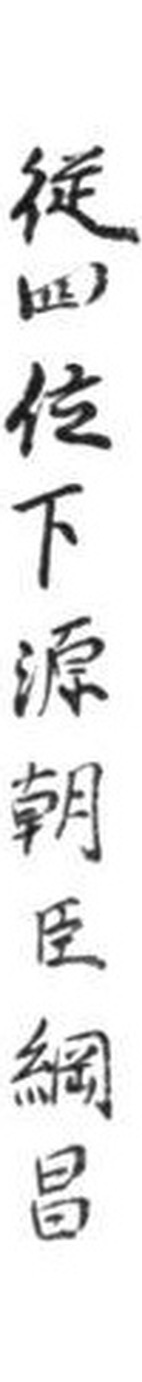従四位下源朝臣綱昌
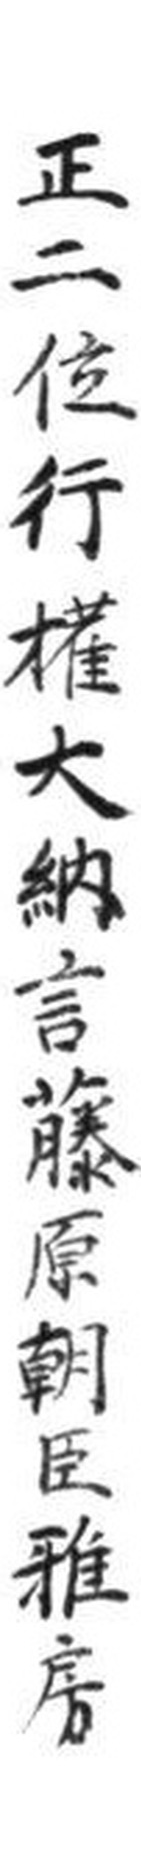正二位行権大納言藤原朝臣雅房
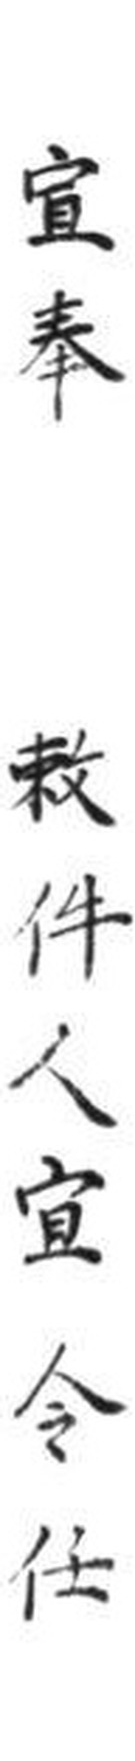宣奉勅件人宜令任
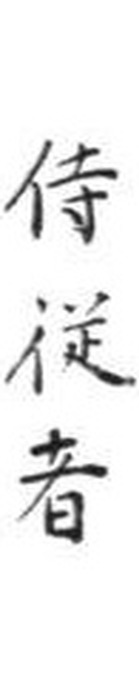侍従者
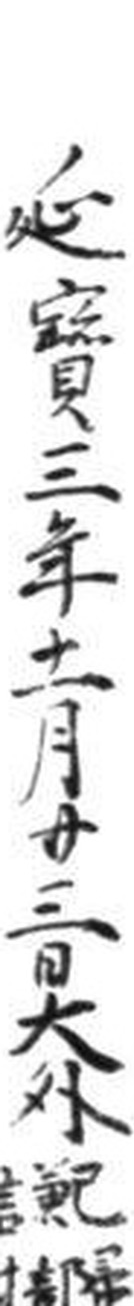延宝三年十一月廿三日宣旨
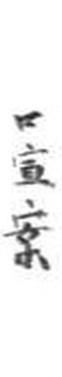口宣案
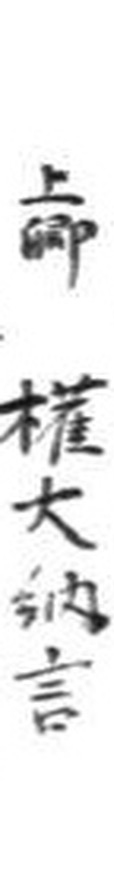上卿権大納言
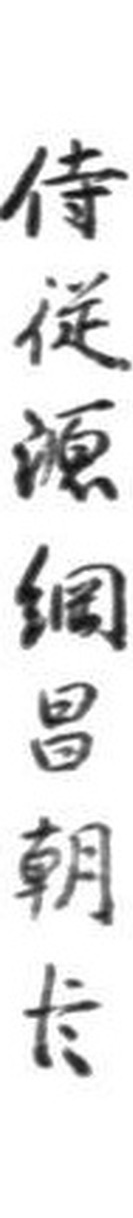侍従源綱昌朝臣
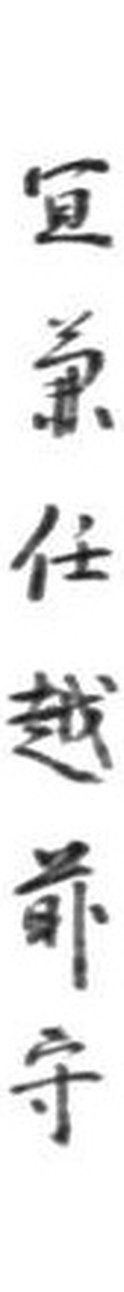宜兼任越前守
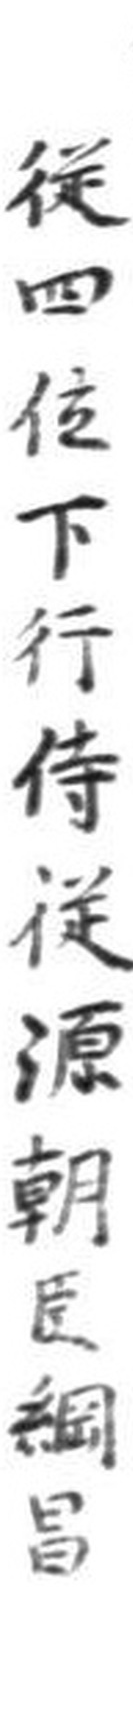従四位下行侍従源朝臣綱昌
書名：家譜 十三 綱昌公 従寛文元年到延宝五年
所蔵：福井県文書館 Fukui Prefectural Archives
